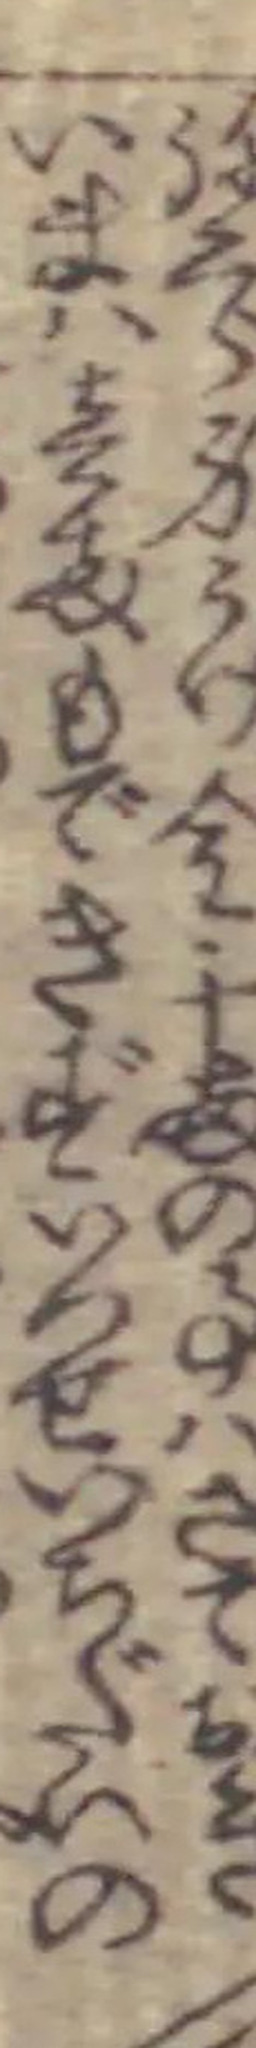いまは壱量もできずいつせいいちだいの
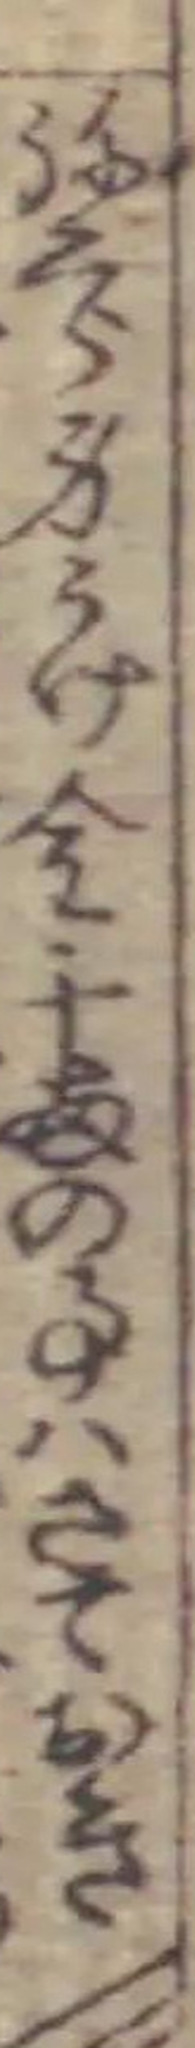弥二郎身うけ金千両の事はさておき
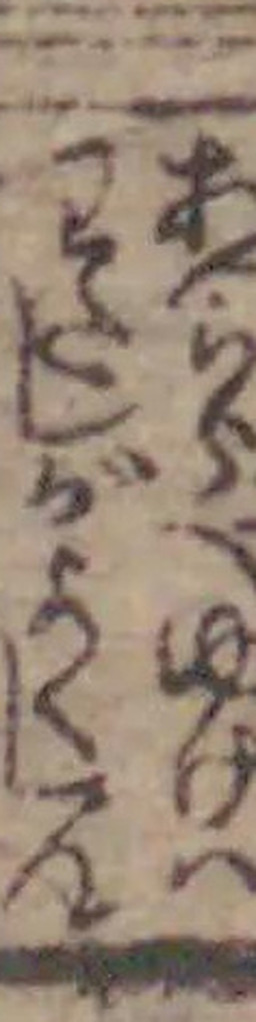わたしがよくしん
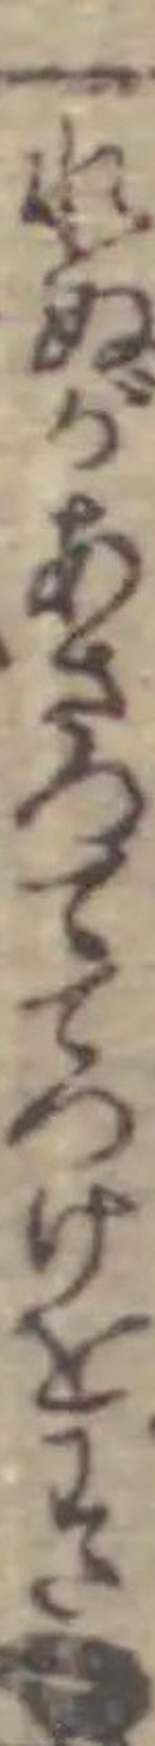れぬがあさつててつけをわた
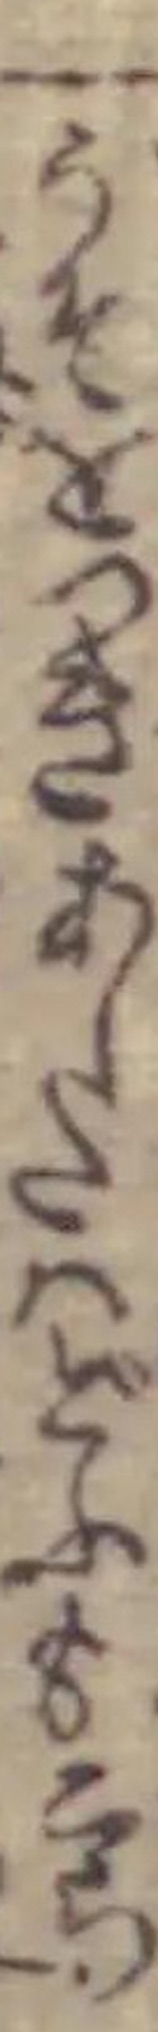うそをつきあしたはどふもこら
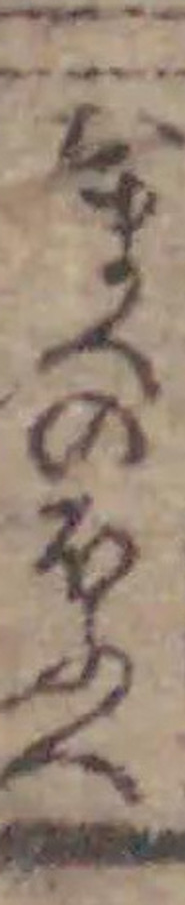おまへのほふへ
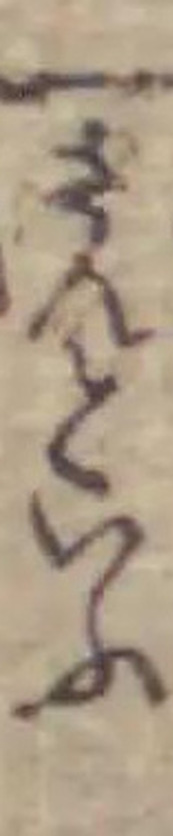さんといふ
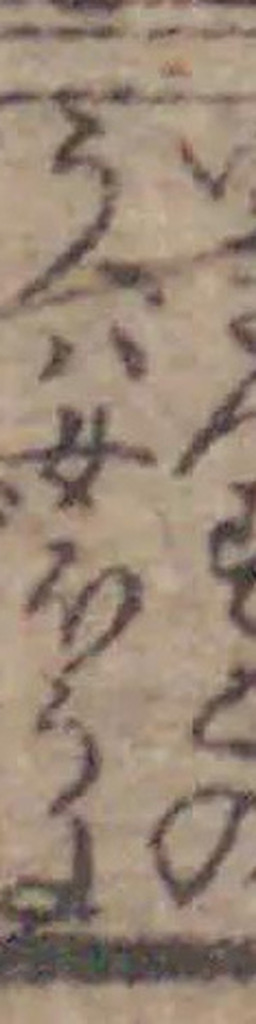うへは女ほうに
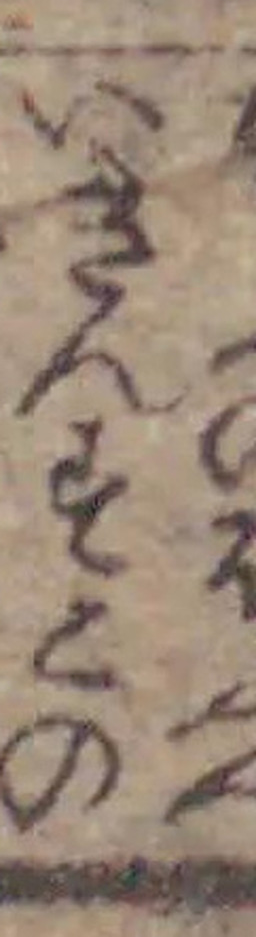いきんすこの
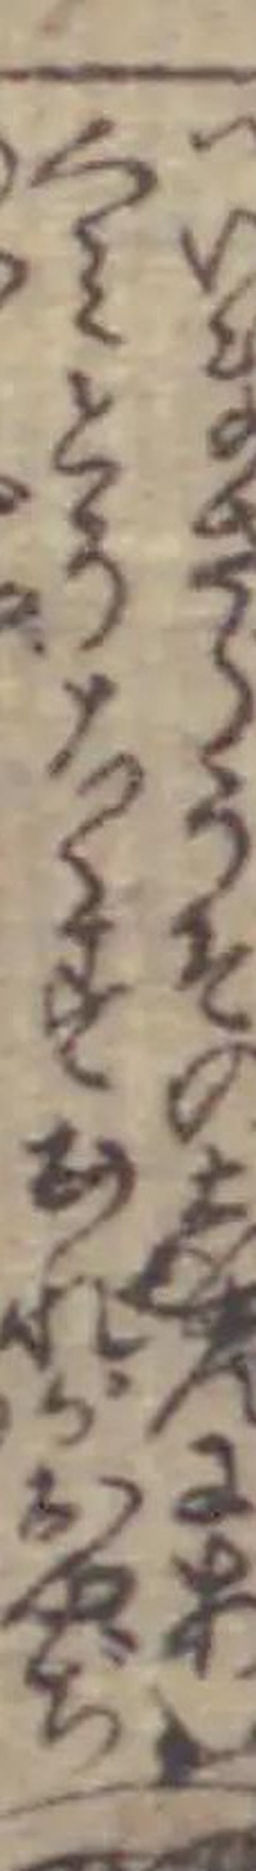くみとうなゝすおれがおやぢ
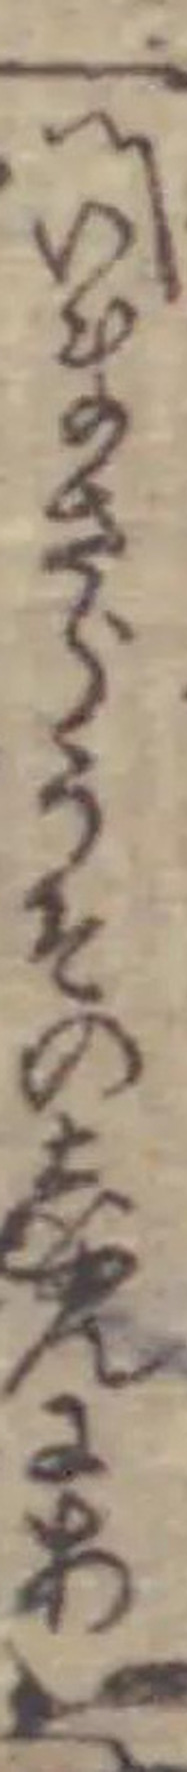「いまさらうそのしやんにあ
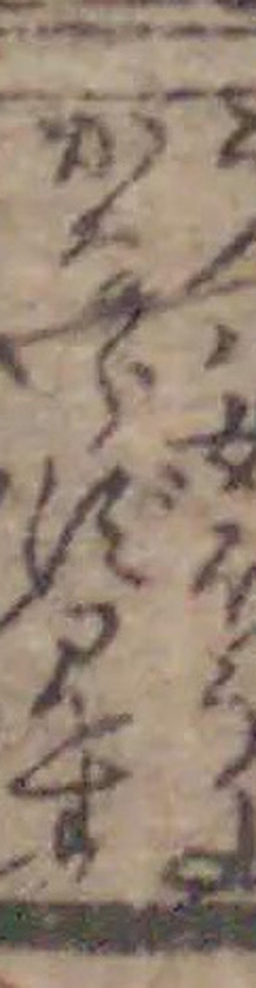かならず見す
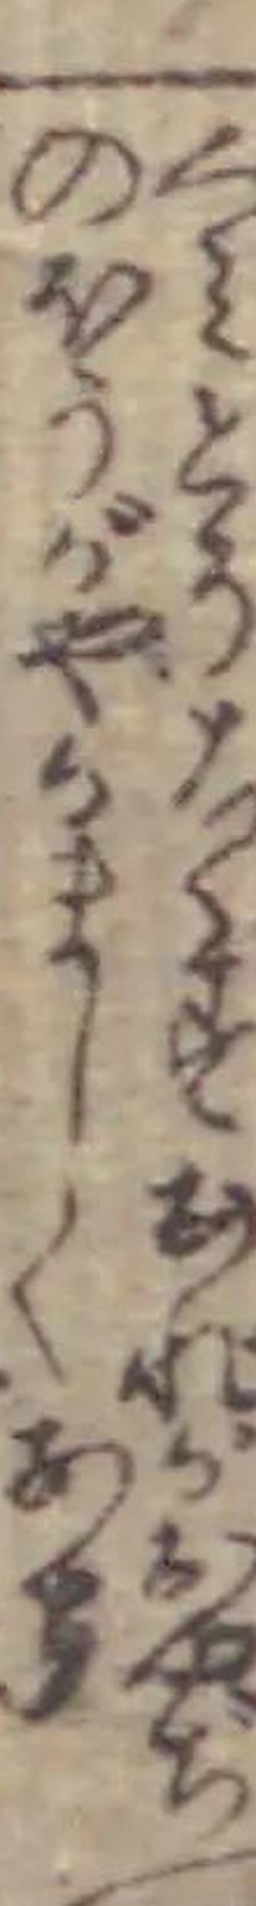のほうがやかましくおち
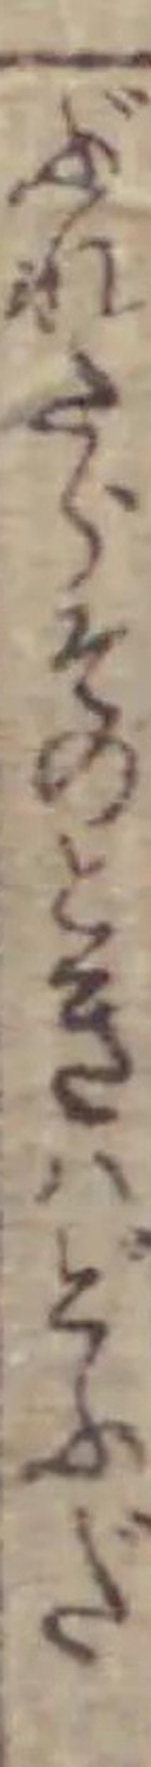ぶれたらそのときはどふだ

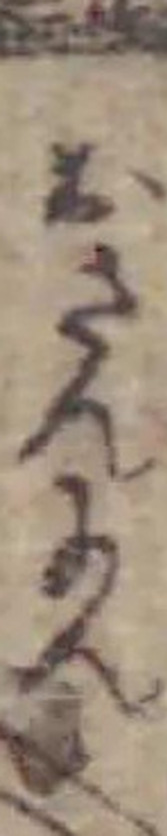おさんにん
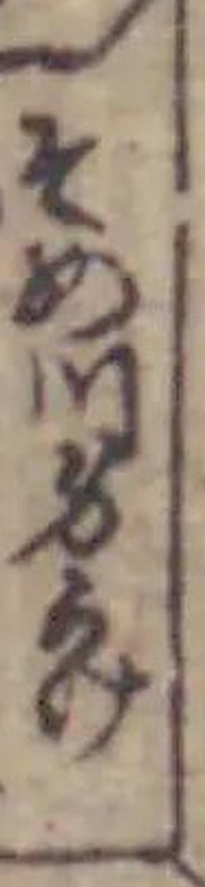そめ川身うけ
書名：虚言弥二郎傾城誠 3巻
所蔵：国立国会図書館 National Diet Library, JAPAN
